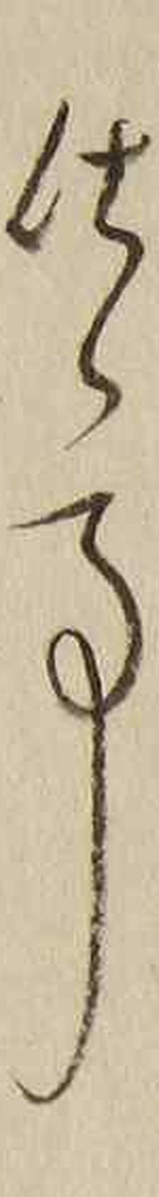仕候事
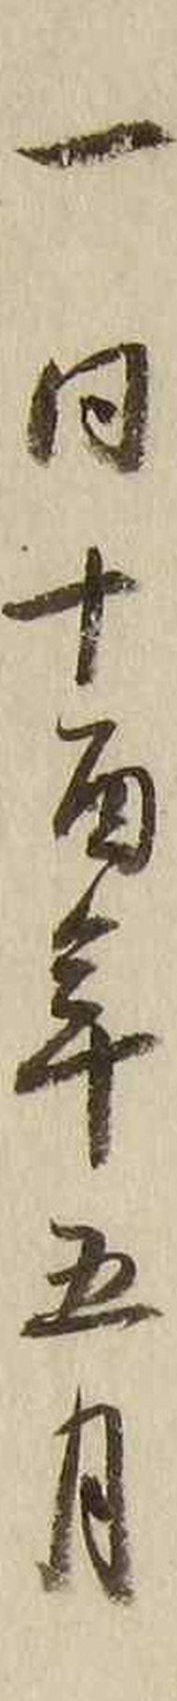一同十酉年五月
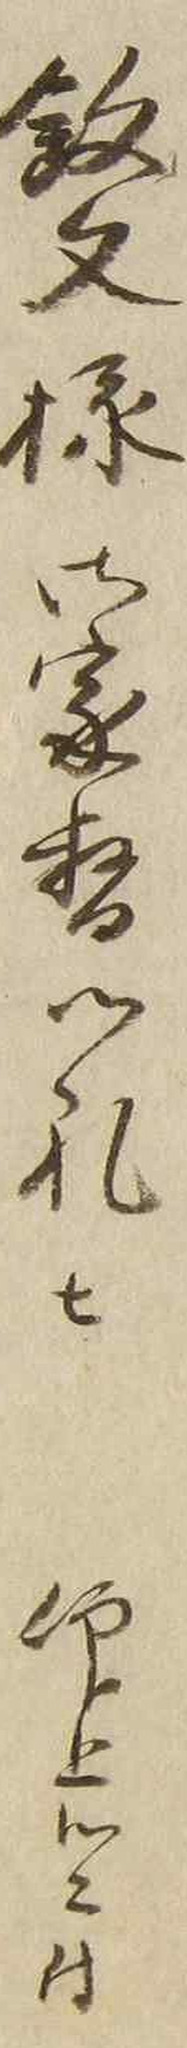欽文様御家督御礼被仰上候に付

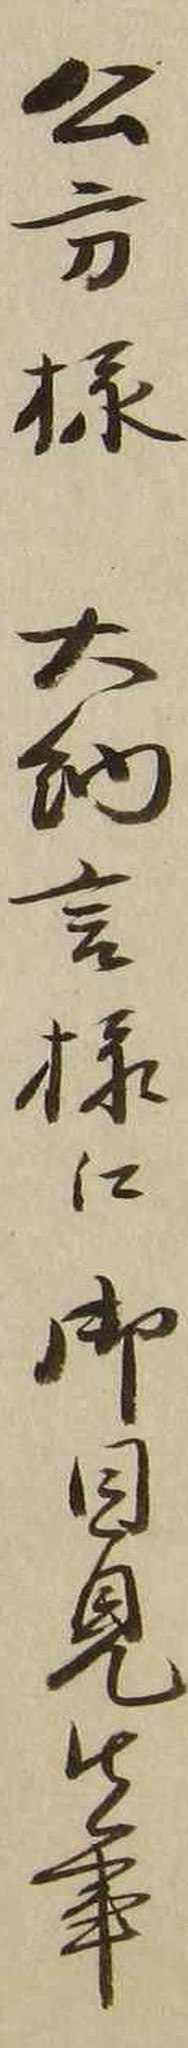公方様大納言様江御目見仕候事
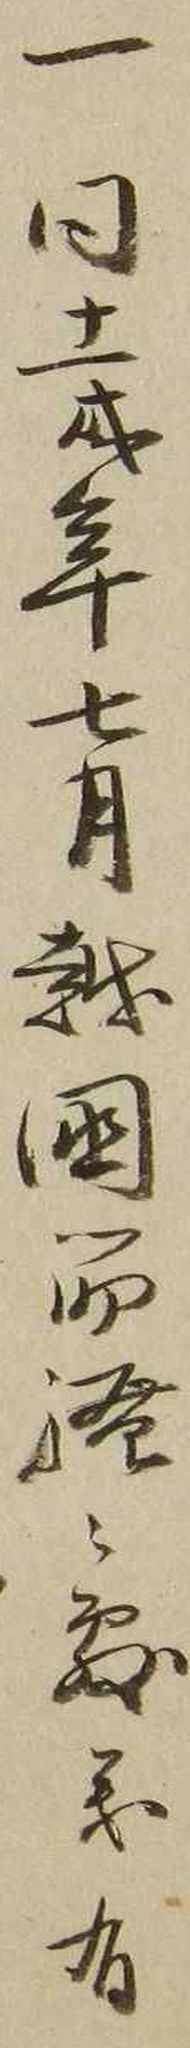一同十一戌年七月越国筋騒々敷義有
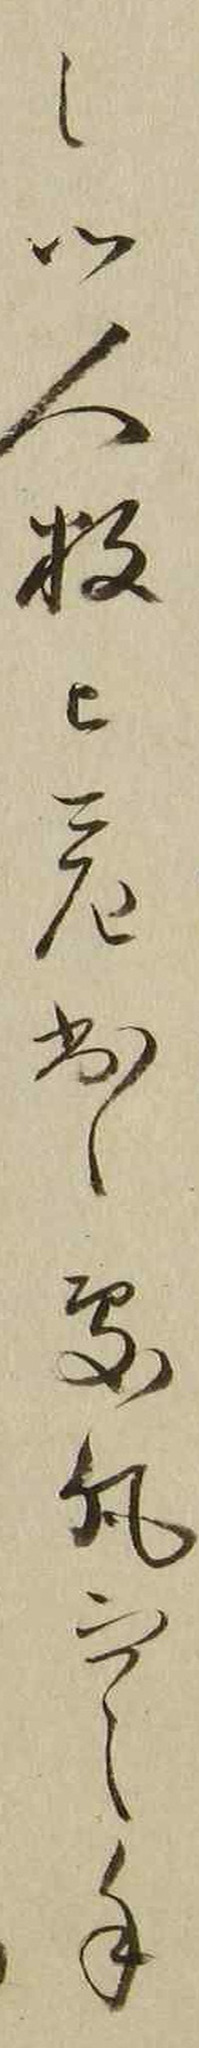之御人数被差出候処気色之手
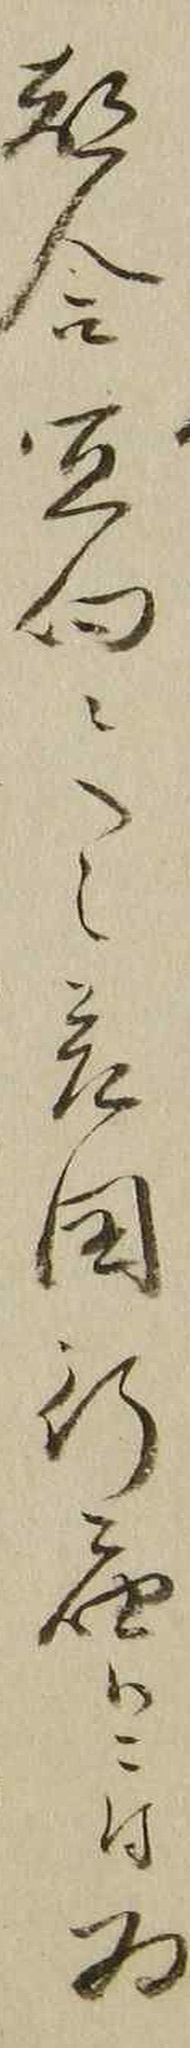都合宜向々へ之差図行届候に付為
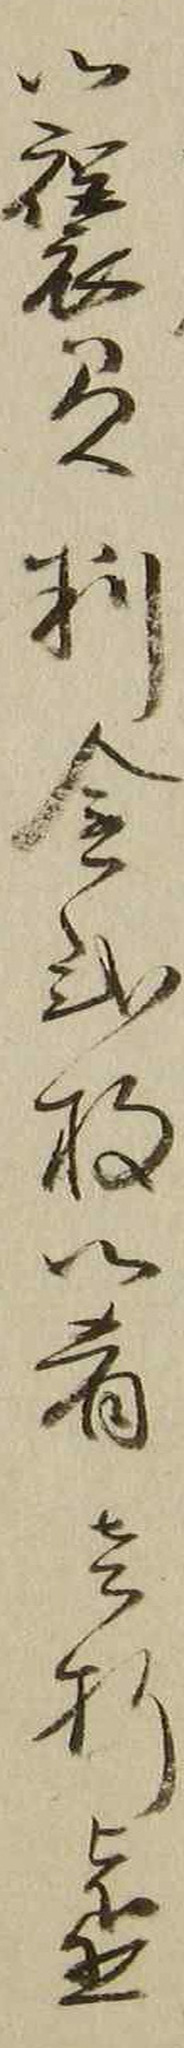御褒美判金弐枚御肴壱折被下置
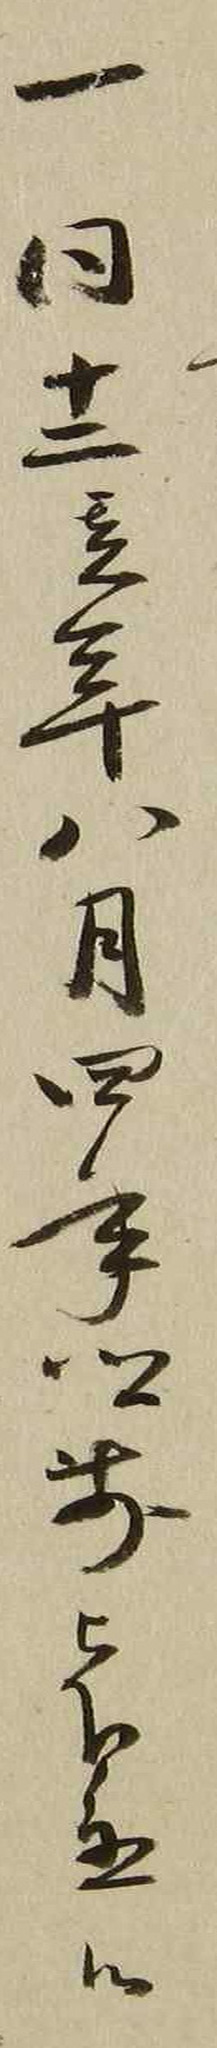一同十二亥年八月四年以前被下置候
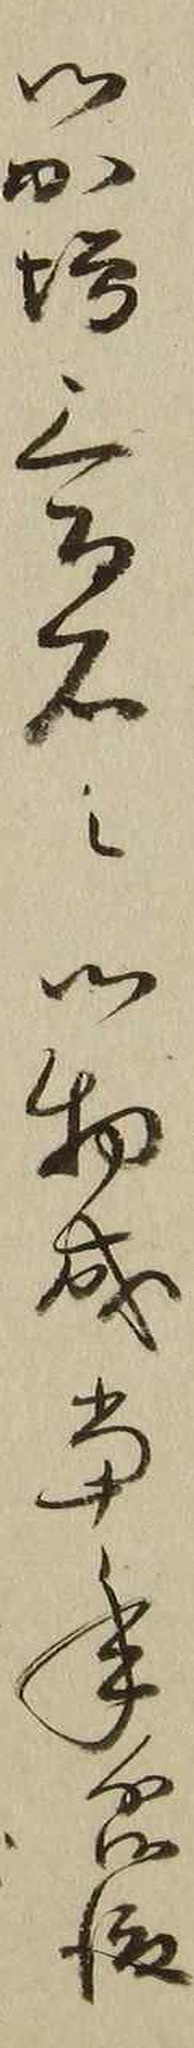御加増三百石之御物成当年ゟ以後
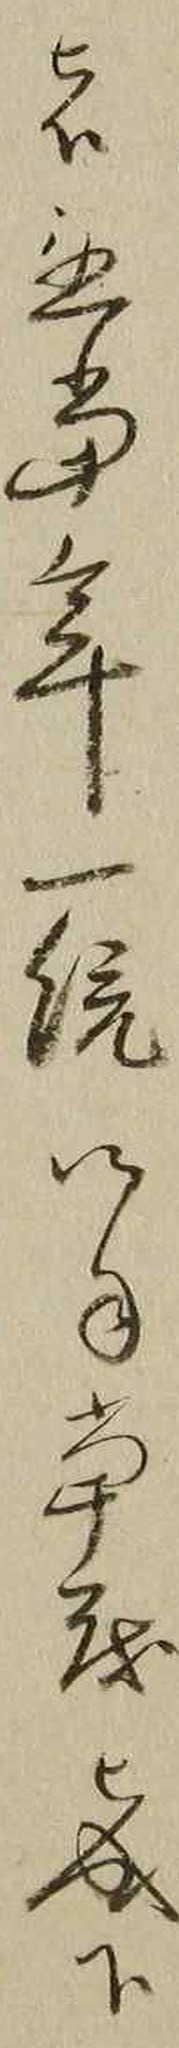被下置当年一統御手当も被成下
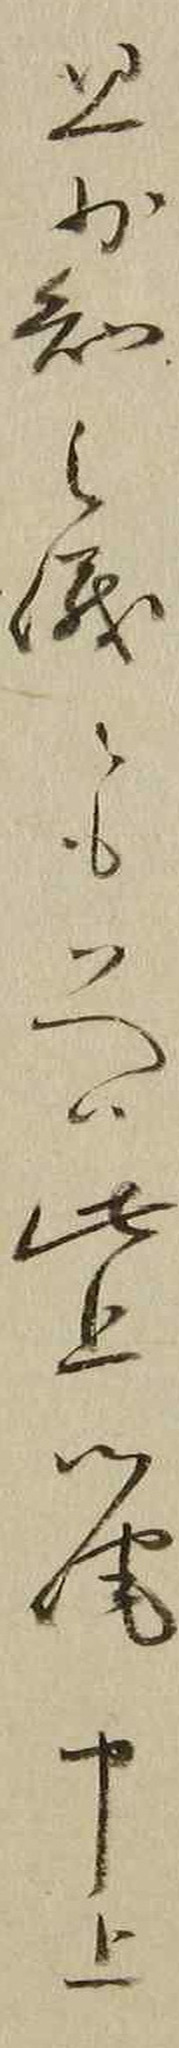且少知之儀にも候へは此上御供申上
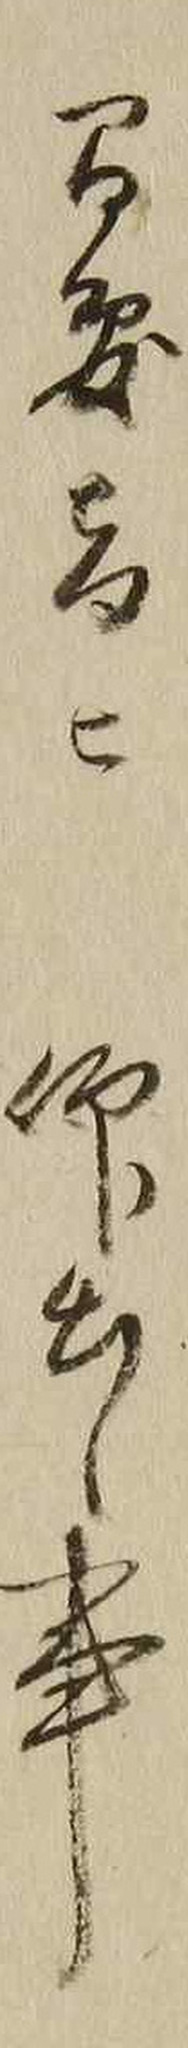間敷旨被仰出候事
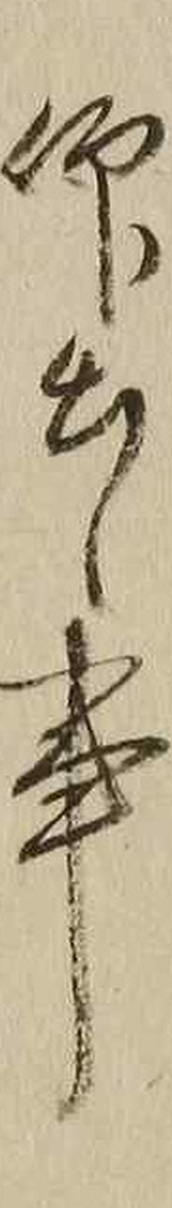仰出候事
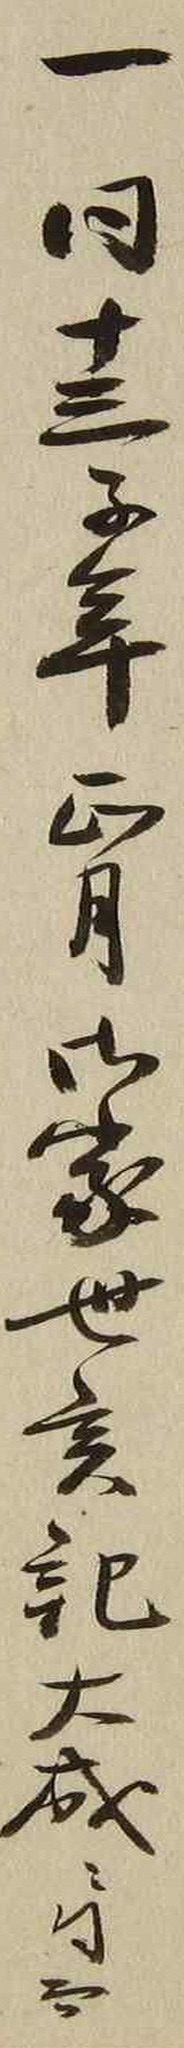一同十三子年正月御家世実記大成に付而
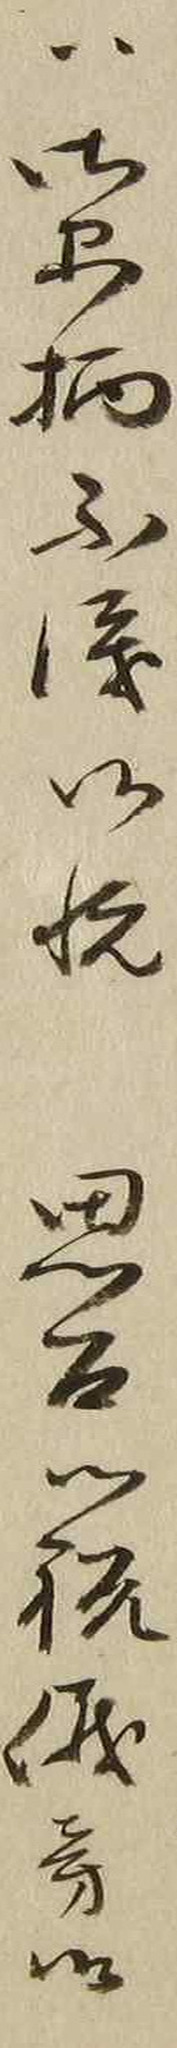は御品柄不浅御悦思召御祝儀旁御
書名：諸士系譜　巻之269　さ之部1
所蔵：会津若松市立会津図書館
